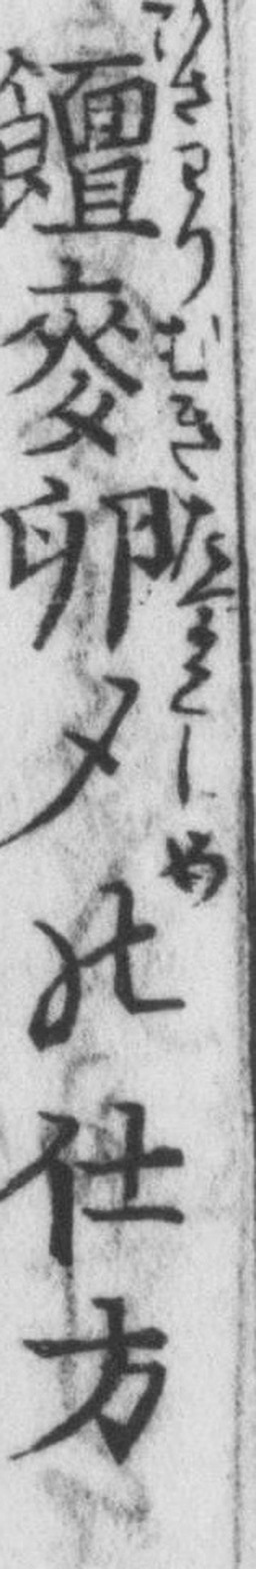饘麦卵〆の仕方
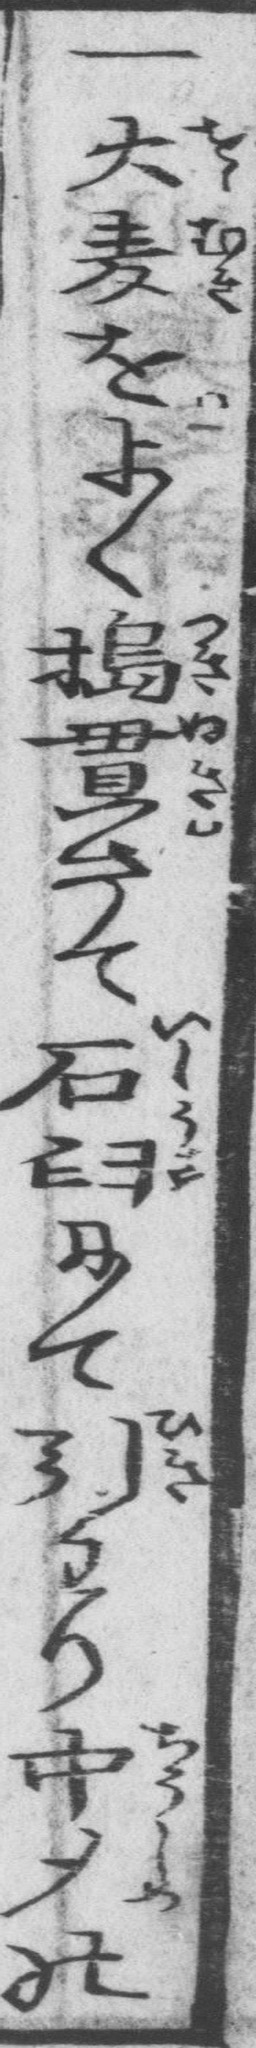一大麦を。よく搗貫。さて石臼にて引わり中〆の
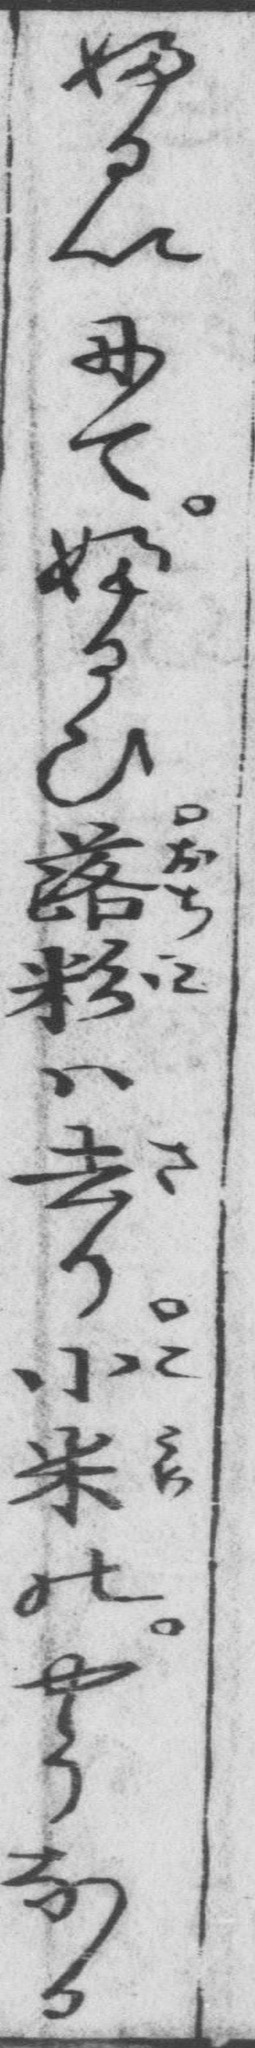ふるいにて。ふるひ。落粉は去り。小米の。やうなる
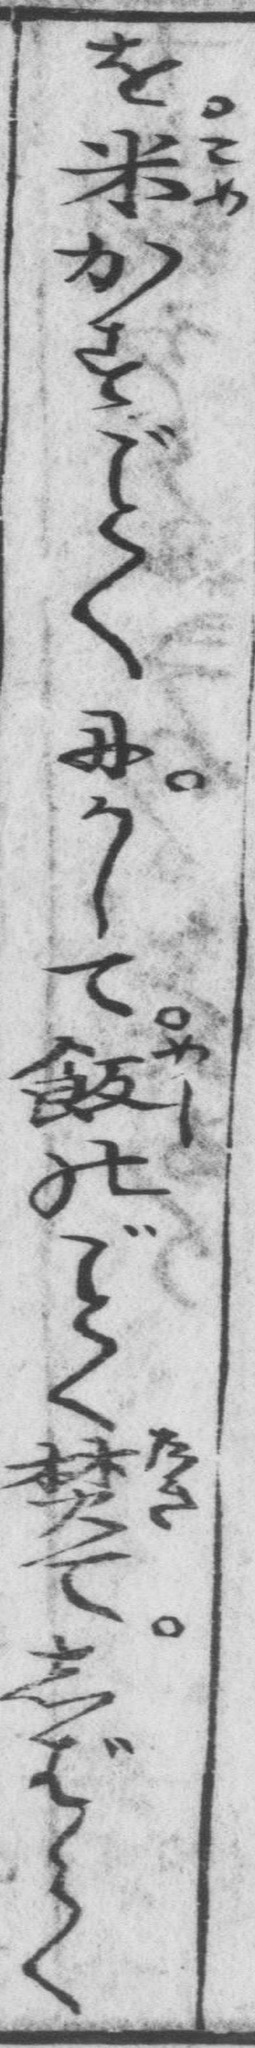を。米かすごとくに。かして。飯のごとく焚て。しばらく
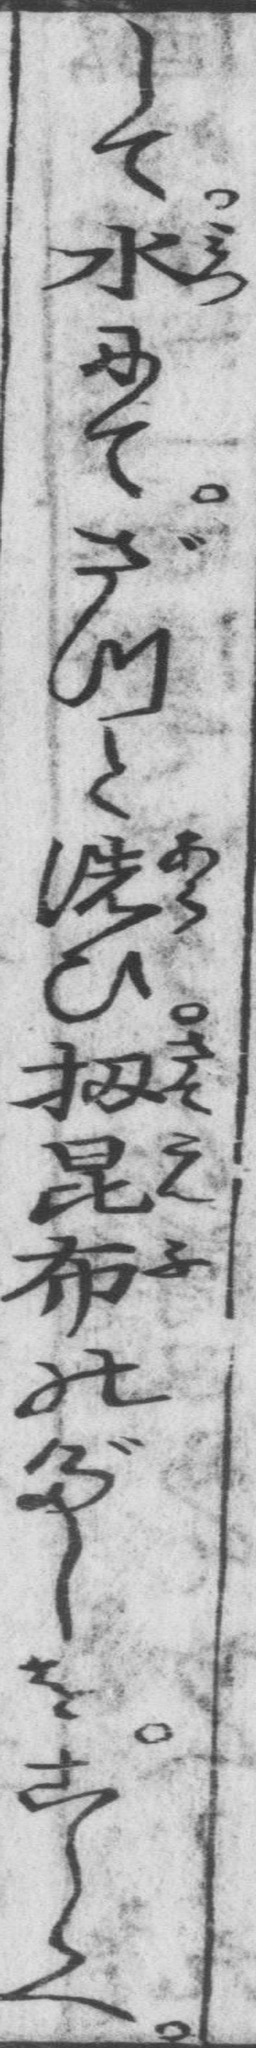して。水にて。ざつと洗ひ。扨昆布のだしを。こしらへ。
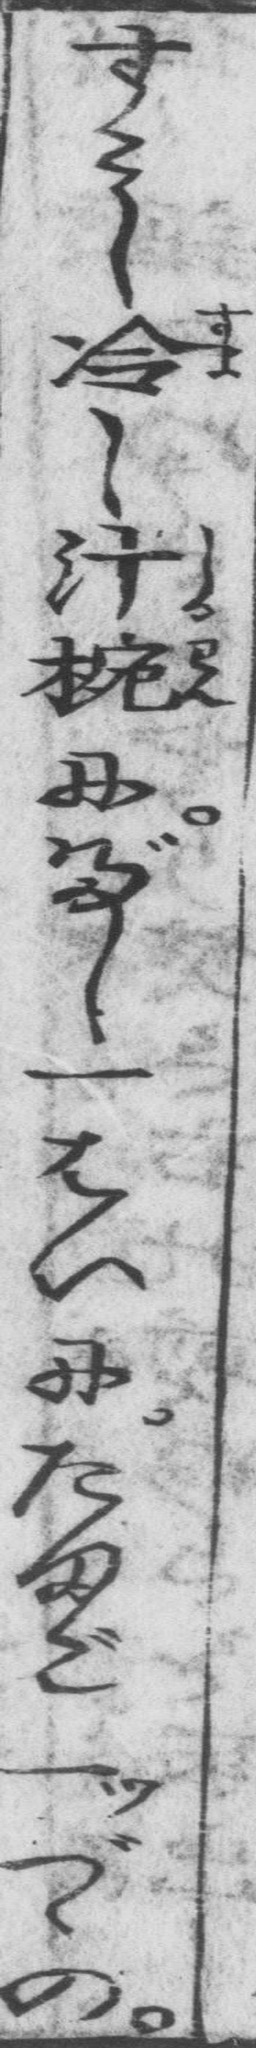すこし冷し汁椀に。だし一はいに。たまご一ツづゝの。
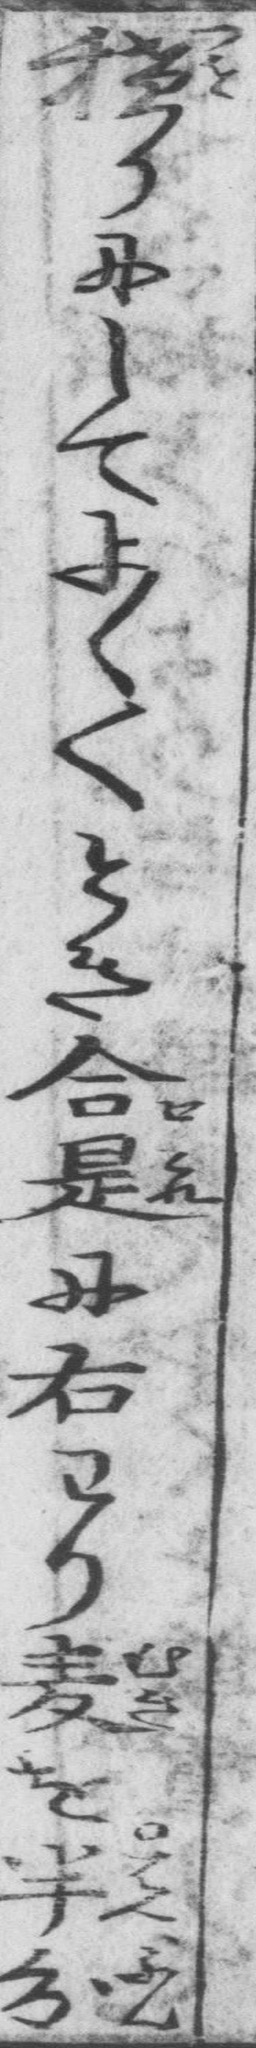積りにしてよく〳〵とき合せ是に右わり麦を。半分
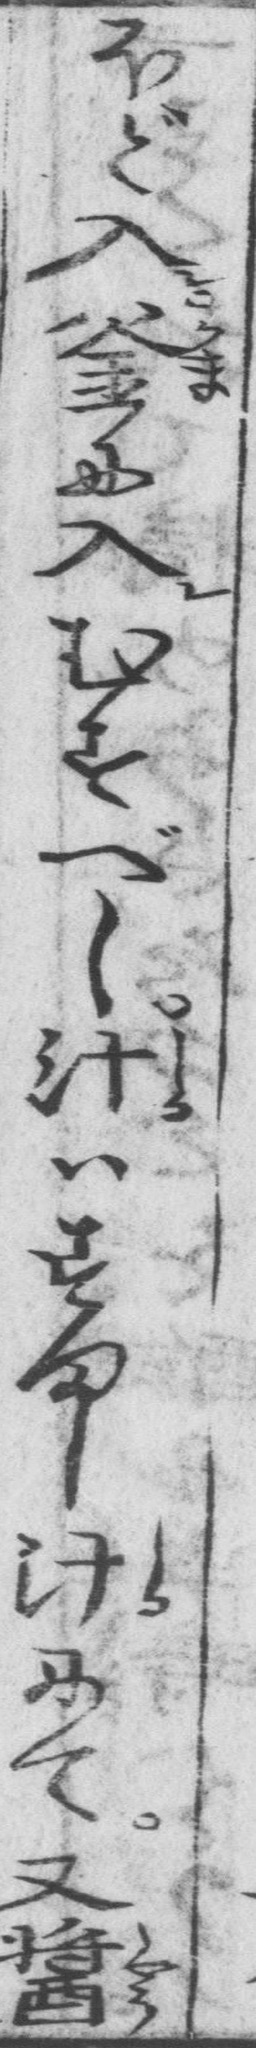ほど入れ。釜に入れむすべし。汁はすまし汁にて。又醤
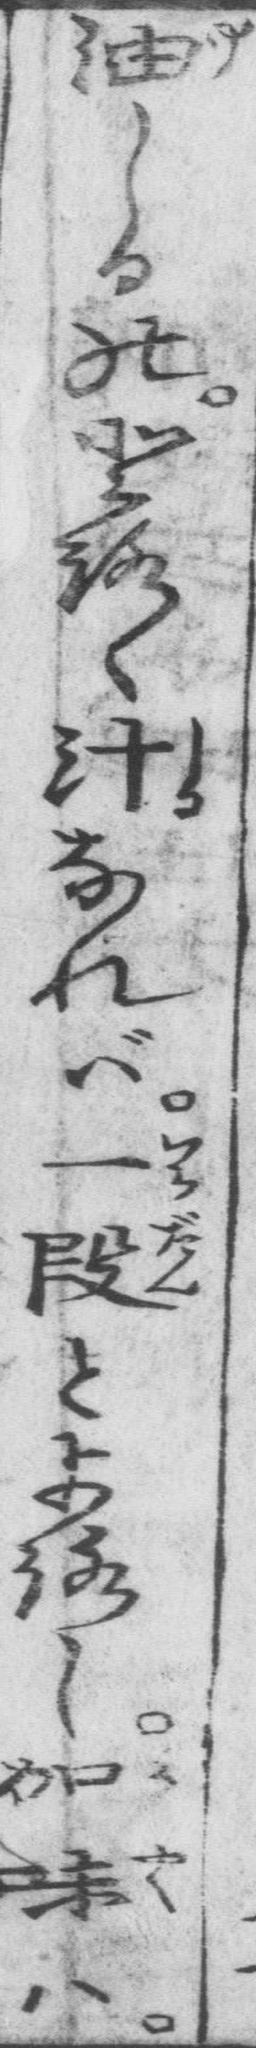油しるの。とろゝ汁なれば。一段とよろし。加味は。
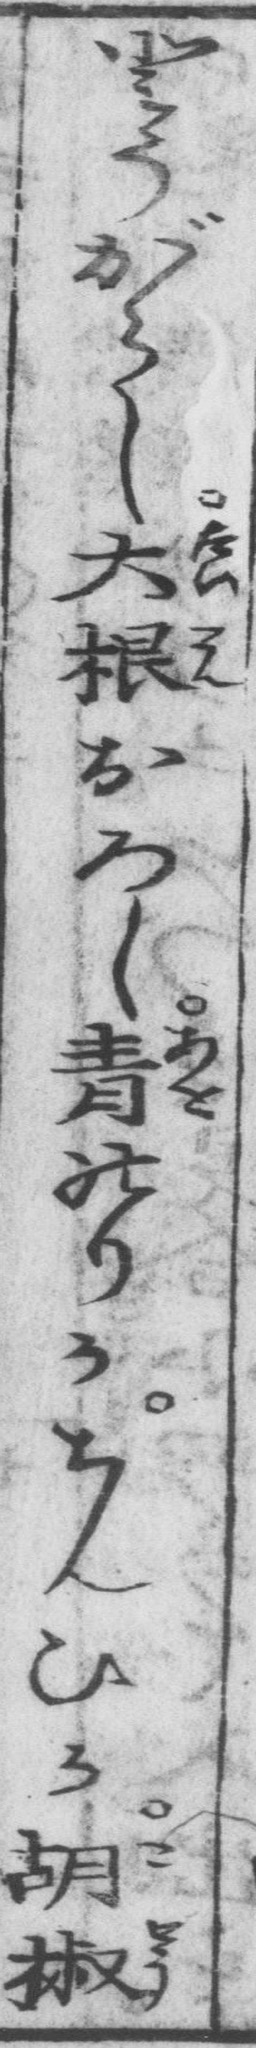とうがらし。大根おろし。青のりか。ちんひか。胡椒

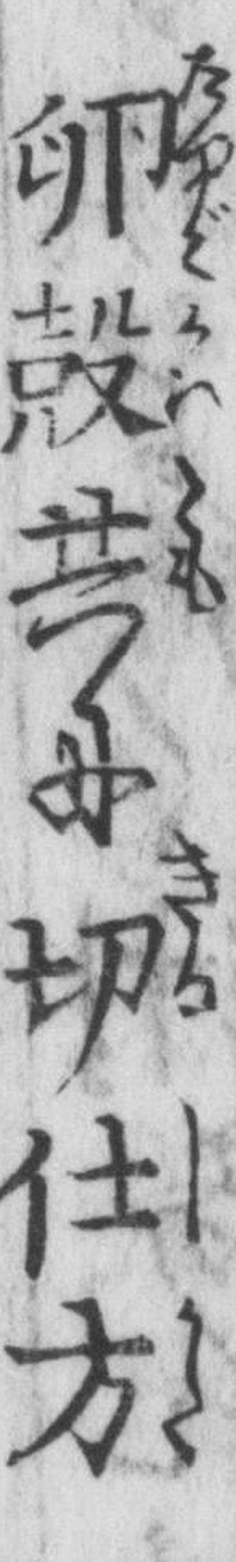卵殻共に切仕方
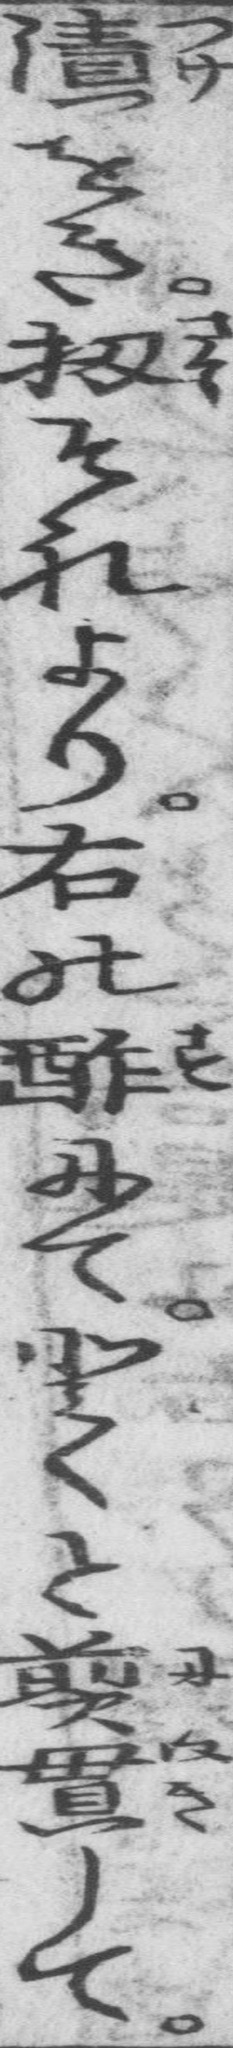漬をき。扨それより。右の酢にて。とくと煎貫して。
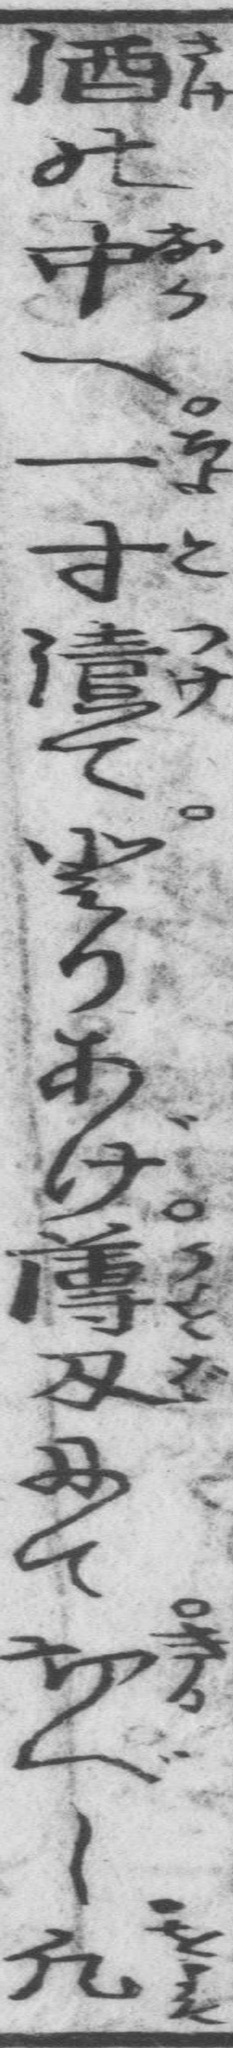酒の中へ。一寸漬て。とりあげ。薄刃にて。切べし。凡
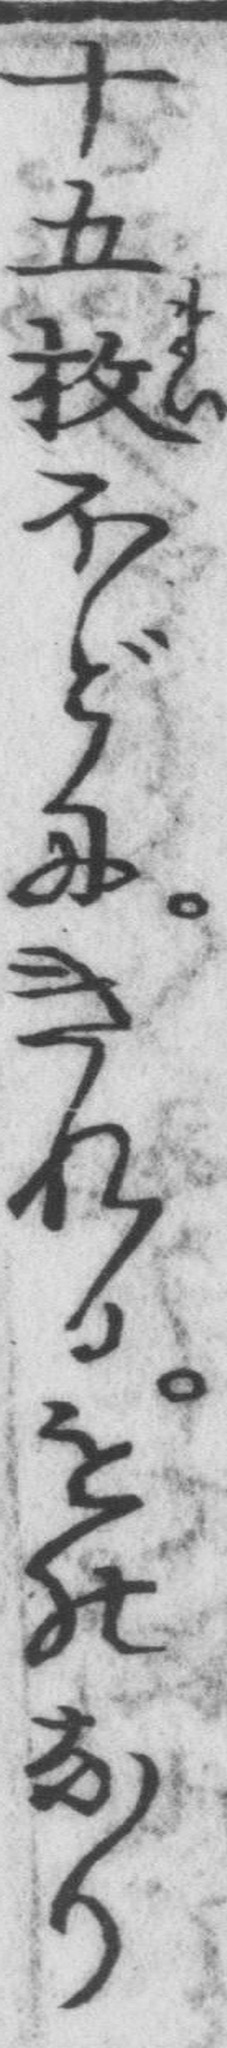十五枚ほどに。きれる。ものなり
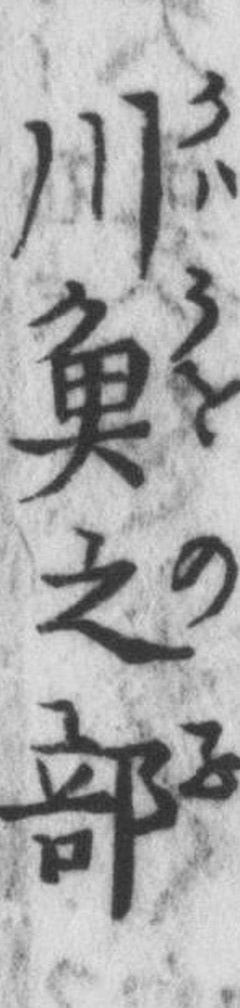川魚之部
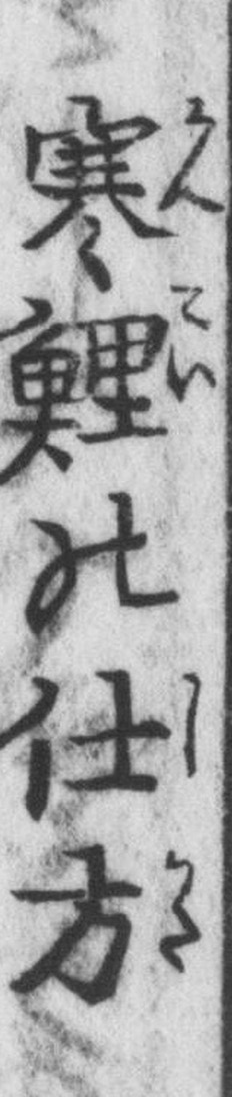寒鯉の仕方
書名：萬寳料理秘密箱
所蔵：大阪府立大学学術情報センター 国文学研究資料館
